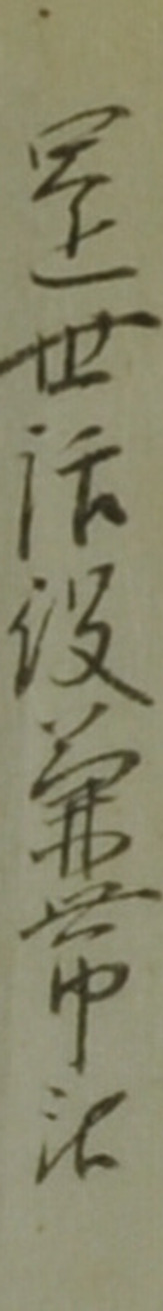置世話役兼帯被
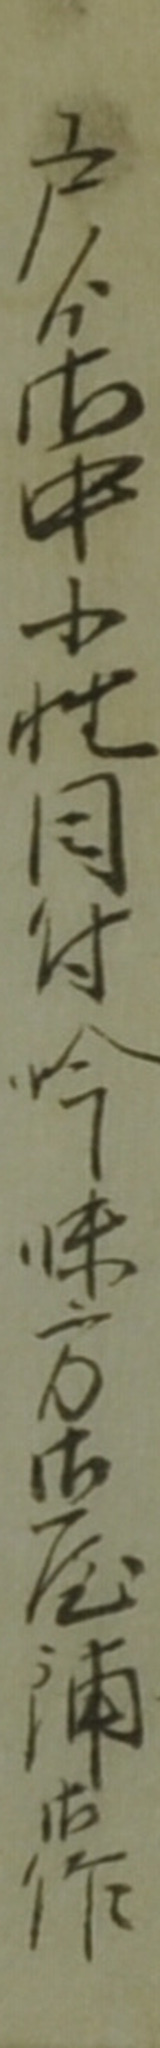戸より御中小姓目付吟味方御屋鋪御作
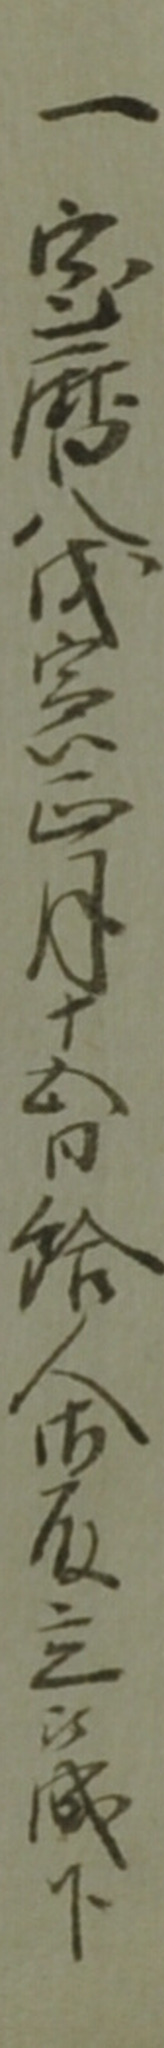一宝暦八戊寅正月十五日給人御取立被成下
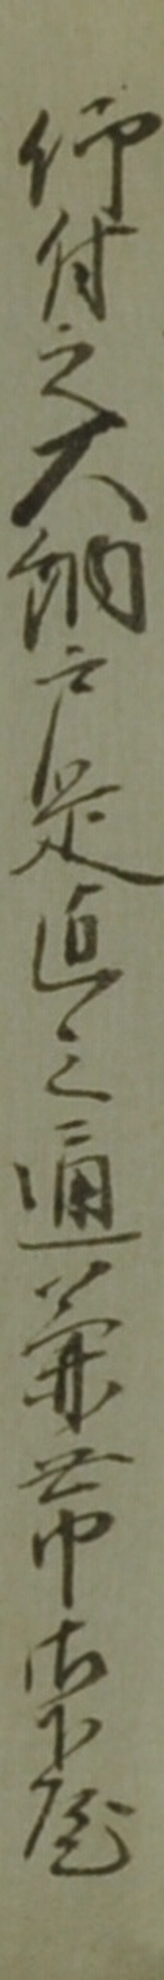仰付之大納戸是迄之通兼帯御下屋
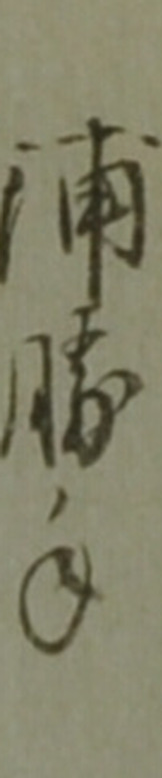鋪勝手
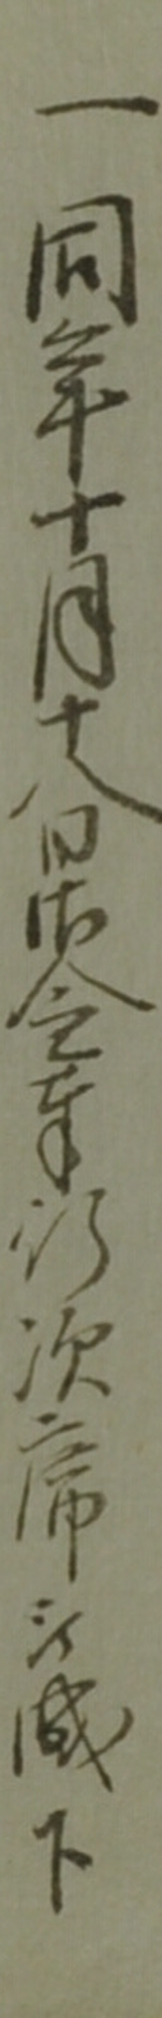一同年十月十八日御金奉行次席被成下
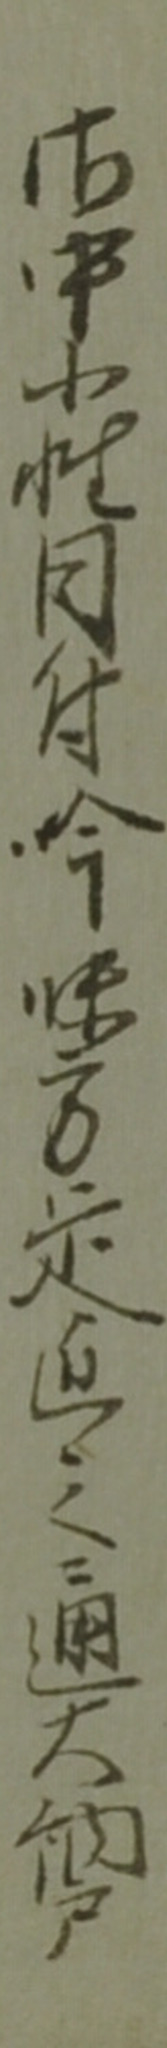御中小姓目付吟味方是迄之通大納戸
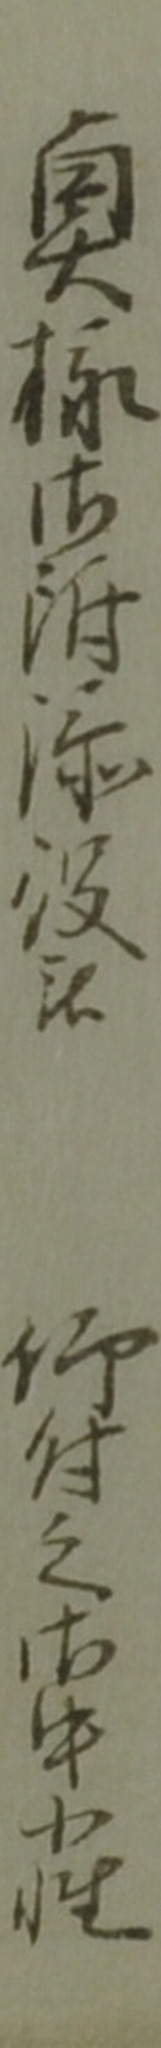奥様御附添役被仰付之御中小姓
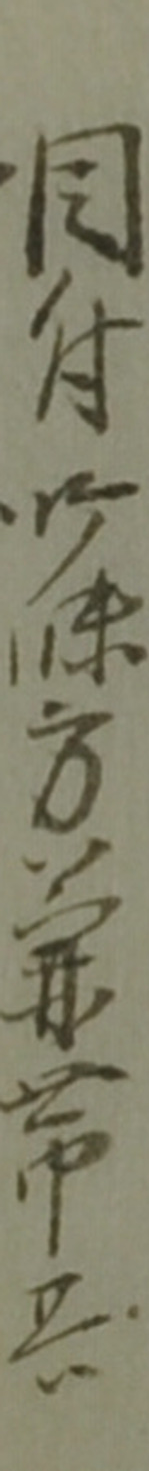目付吟味方兼帯共
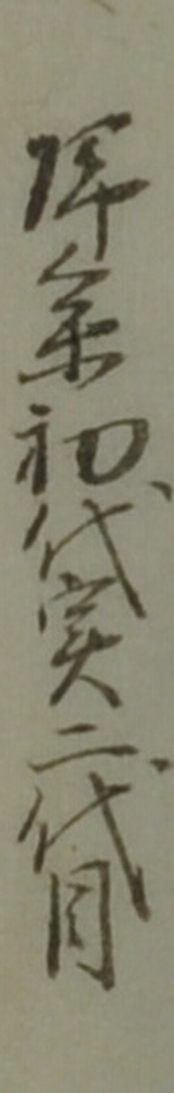帰参初代実二代目
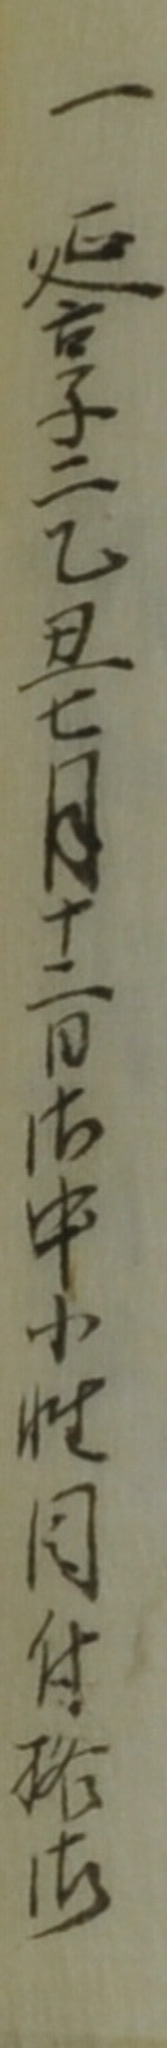一延享二乙丑七月十二日御中小姓目付格御
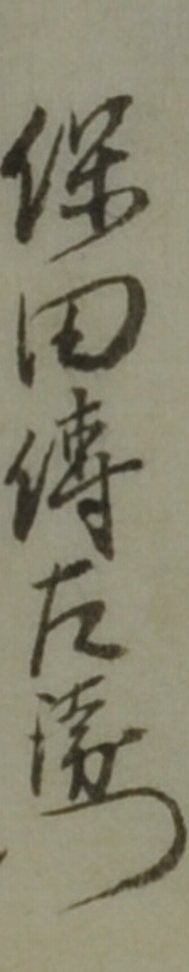保田傳左衛門
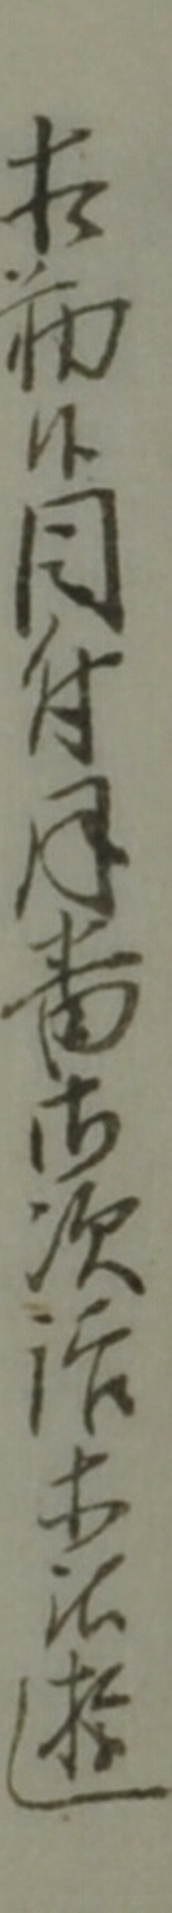相勤候目付月番御次添等被遊
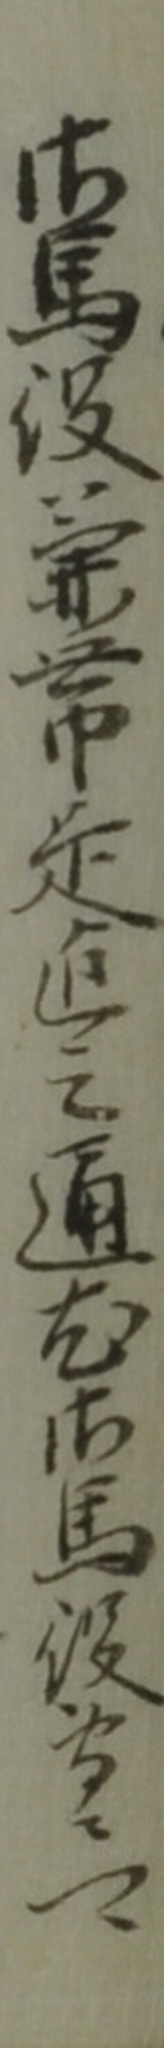御馬役兼帯是迄之通尤御馬役専に可
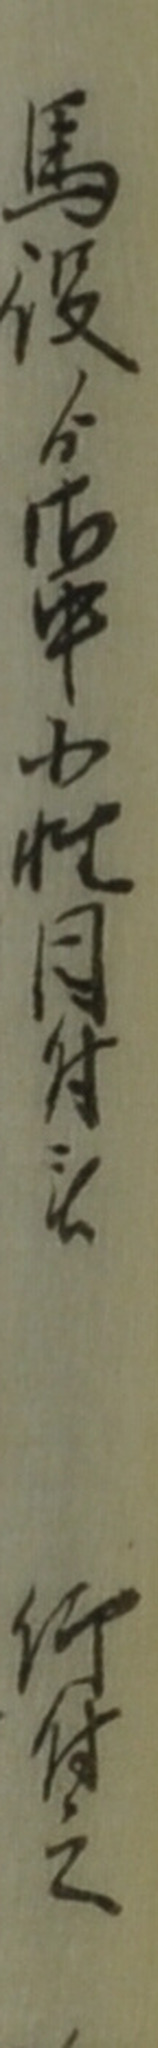馬役より御中小姓目付被仰付之
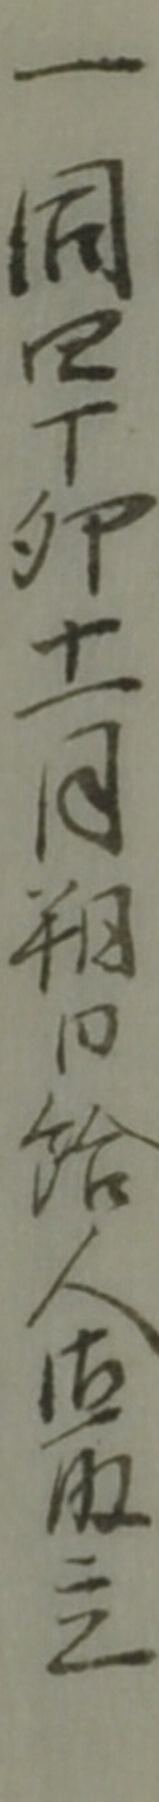一同四丁卯十一月朔日給人御取立
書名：諸御役代々録（八）
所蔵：伊那市立高遠町図書館・合同会社AMANE
